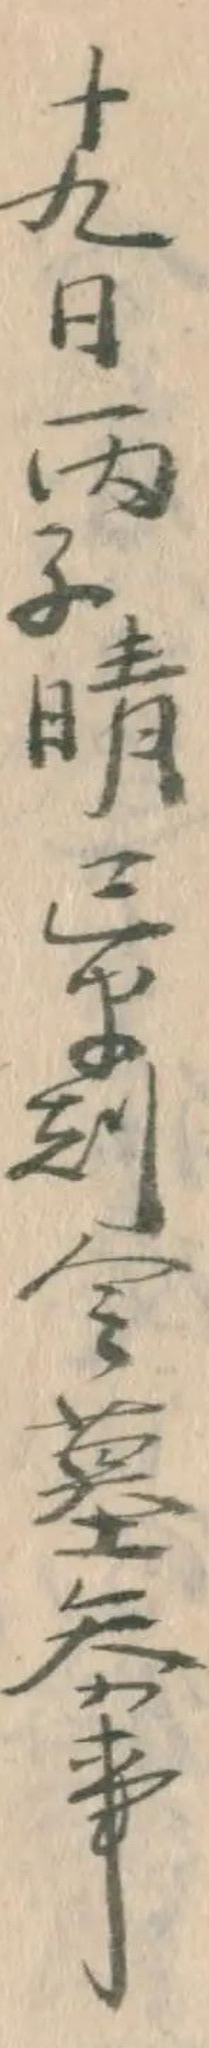十九日丙子晴巳半刻令墓参事
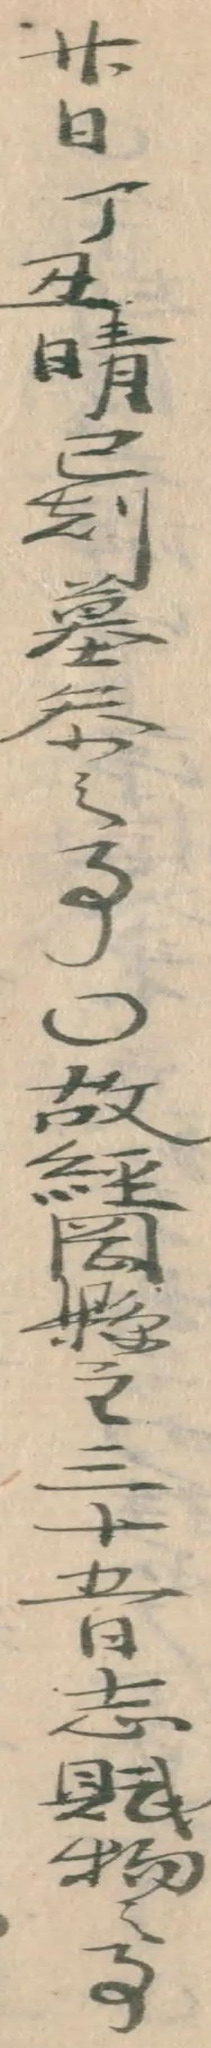廿日丁丑晴巳刻墓参之事○故経岡縣主三十五日志賦物之事
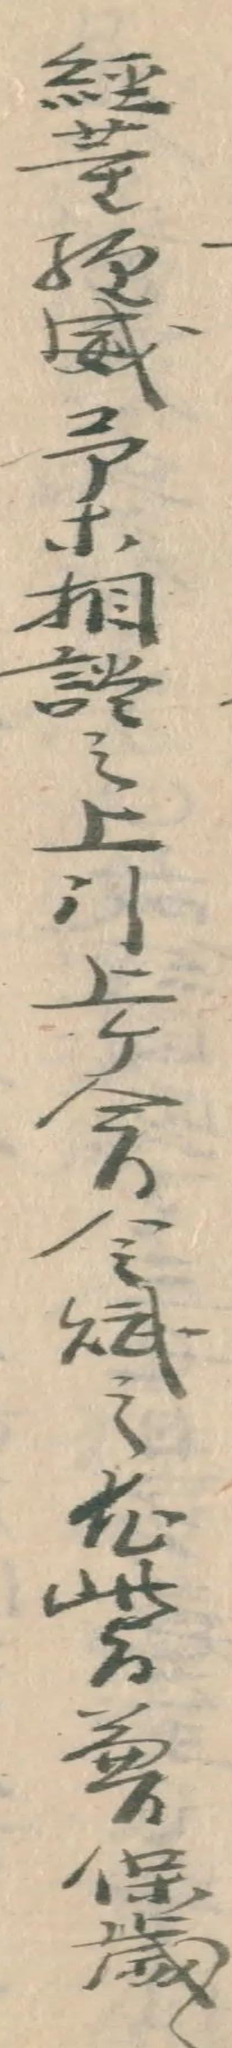経董経威予等相談之上引上ケ今日令之尤此旨兼而保歳へ
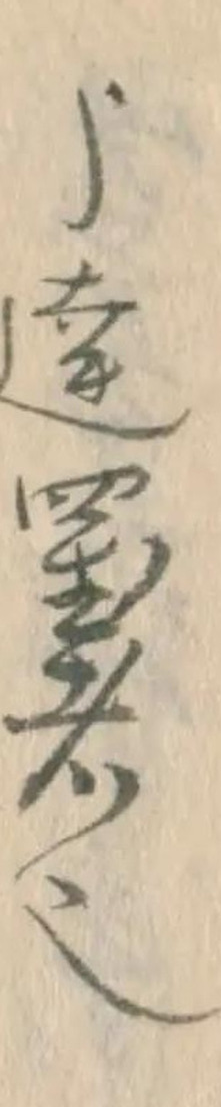申達置者也
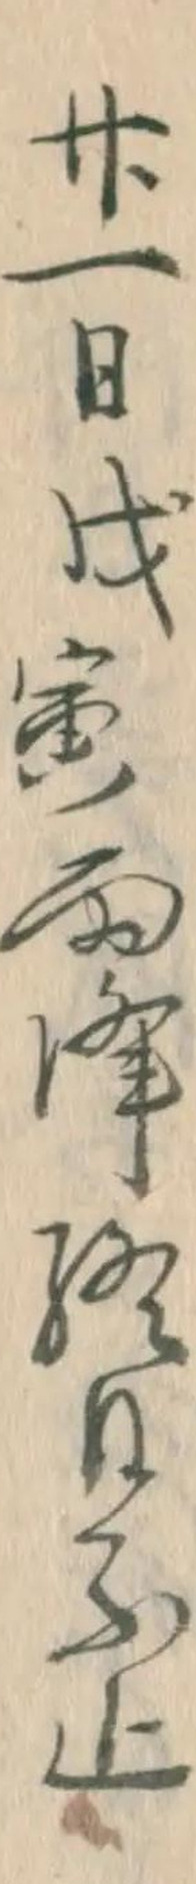廿一日戊寅雨降終日不止
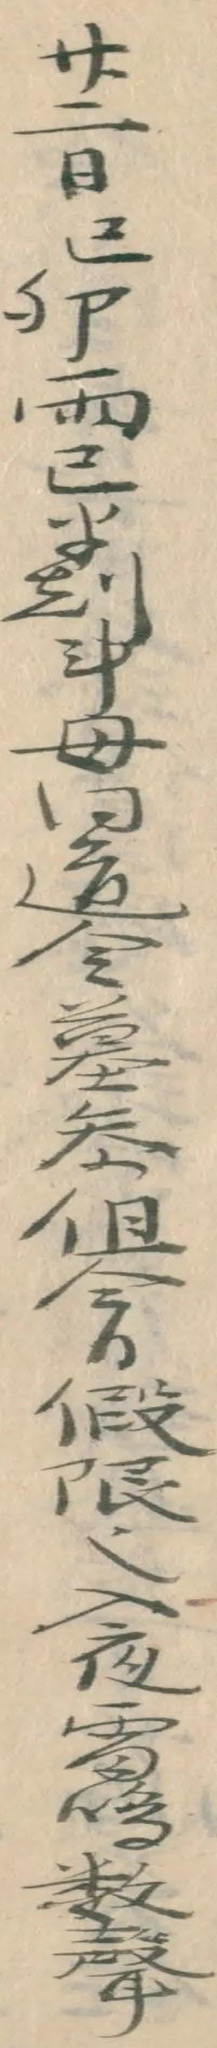廿二日己卯雨巳半刻斗母同道令墓参但今日仮限也入夜雷鳴数聲
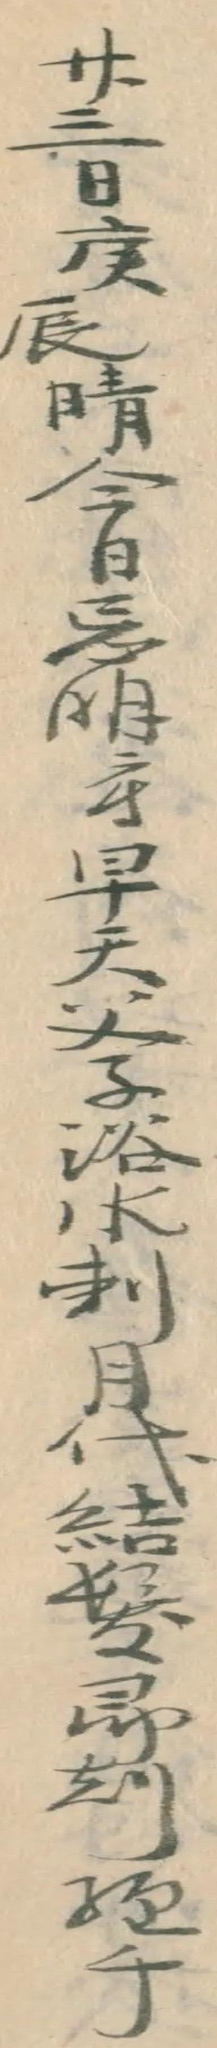廿三日庚巳晴今日忌明ニ付早天父子浴水刺月代結髪即刻経干

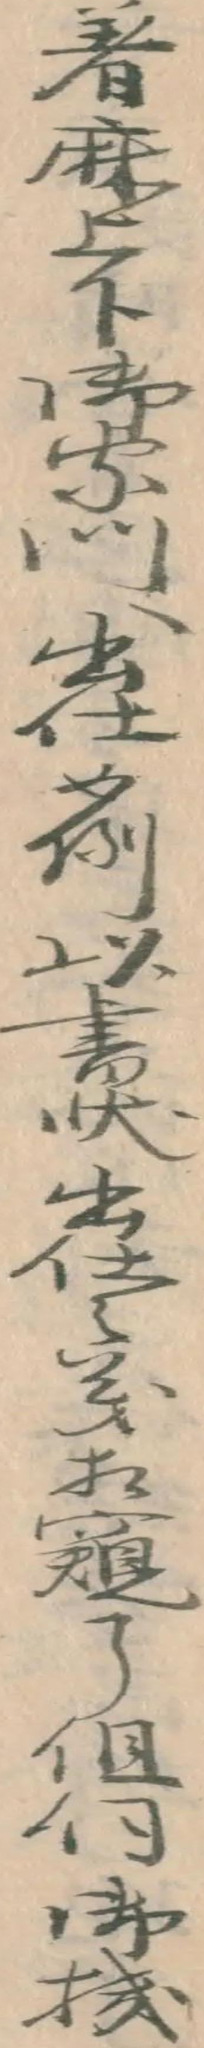着麻上下御家門へ出仕如例以書状出仕之義相窺了但伺御機
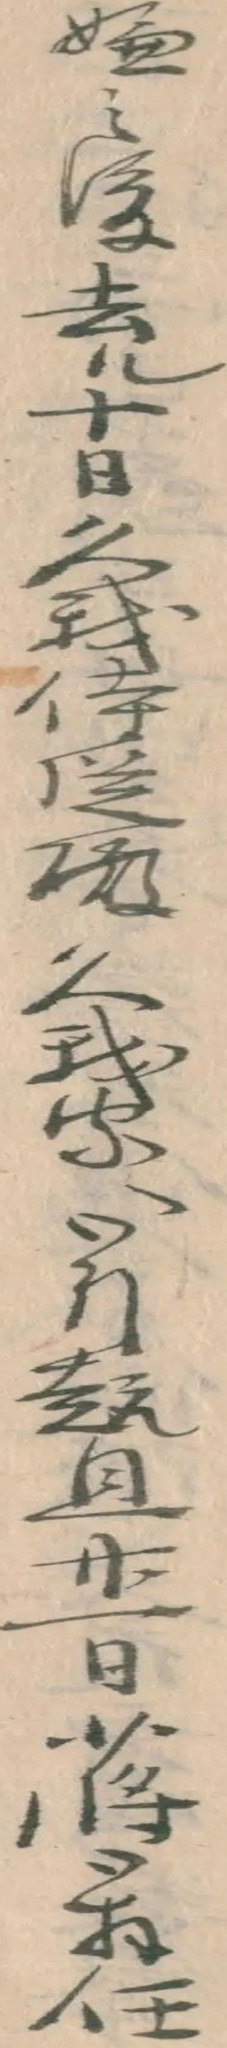嫌之後去ル十日久我侍従殿久我家へ御引趣且廿一日少将御拝任
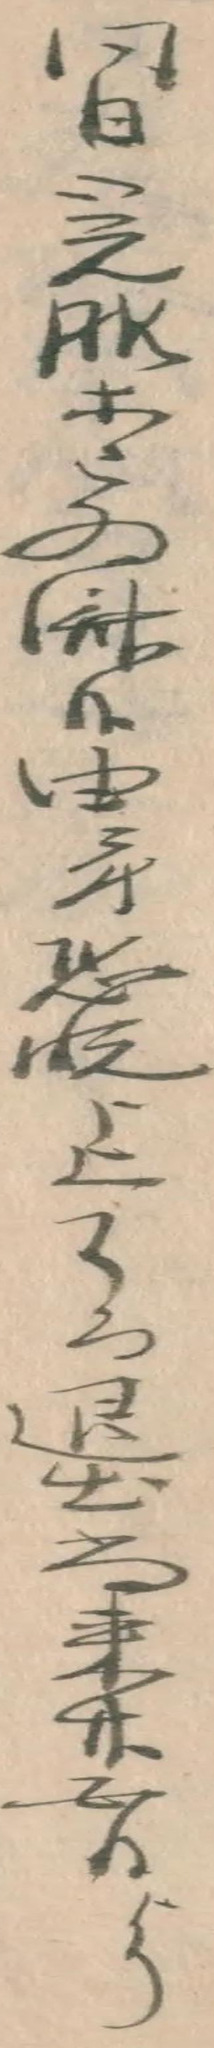同日御元服等被為済候由ニ付恐悦申上了而退出尚来廿五日より
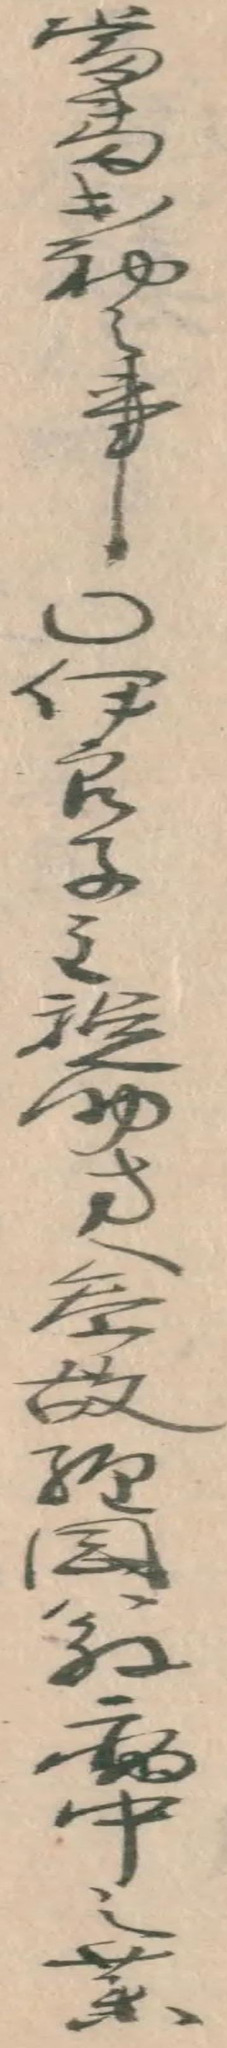當番出勤之事○伊良子主税助方へ参故経岡翁病中之薬
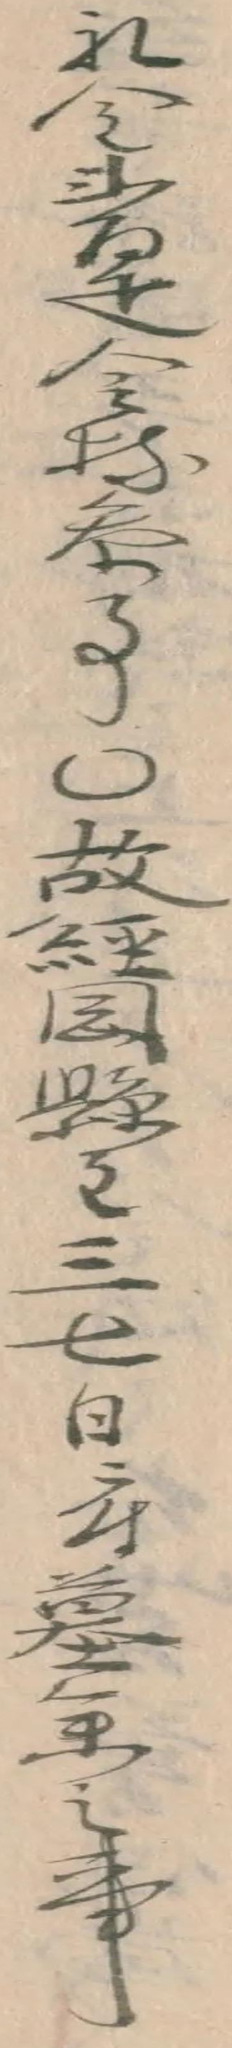礼金弐百疋金持参事○故経岡縣主三七日ニ付墓参之事
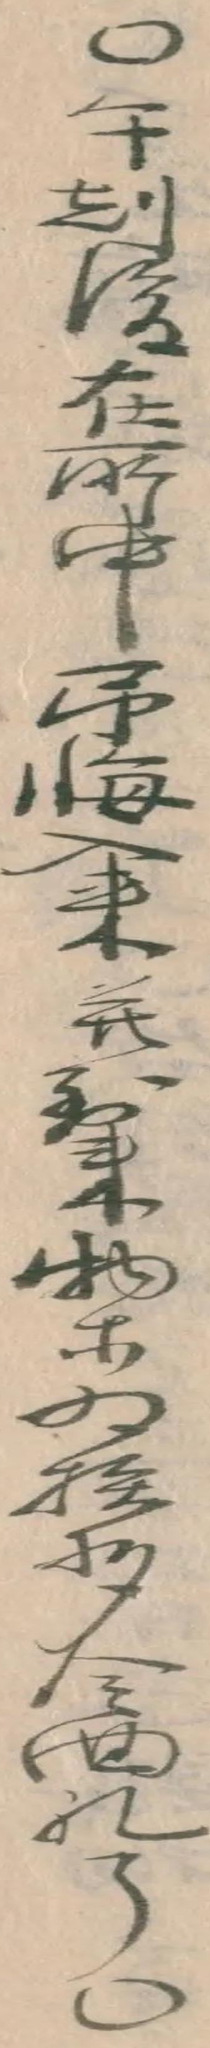○午刻後在所中即悔入来幷到来物等為挨拶今回礼了○
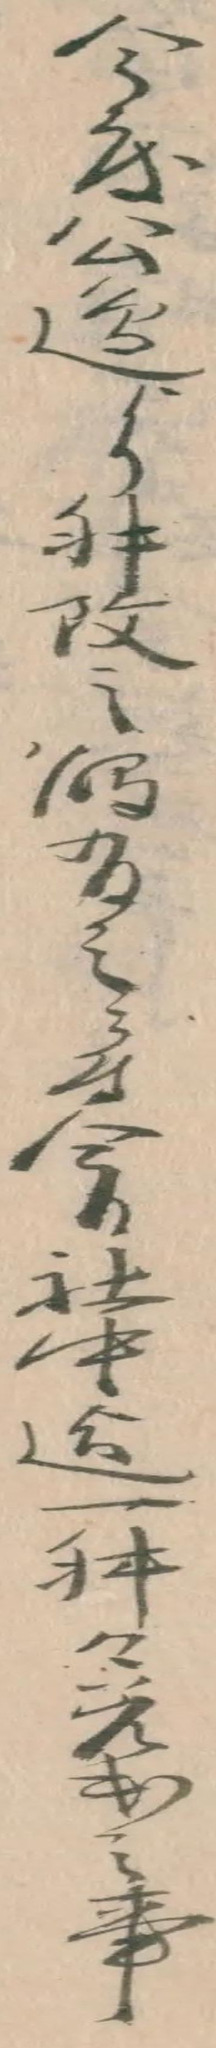今度公邊より躰改之触有之ニ付今日社中迄一躰々差出之事
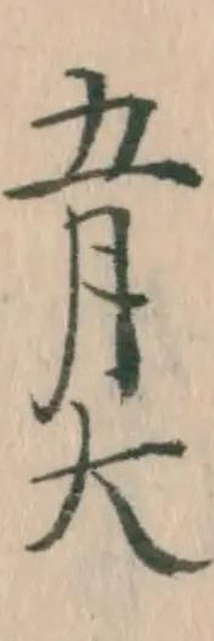五月大
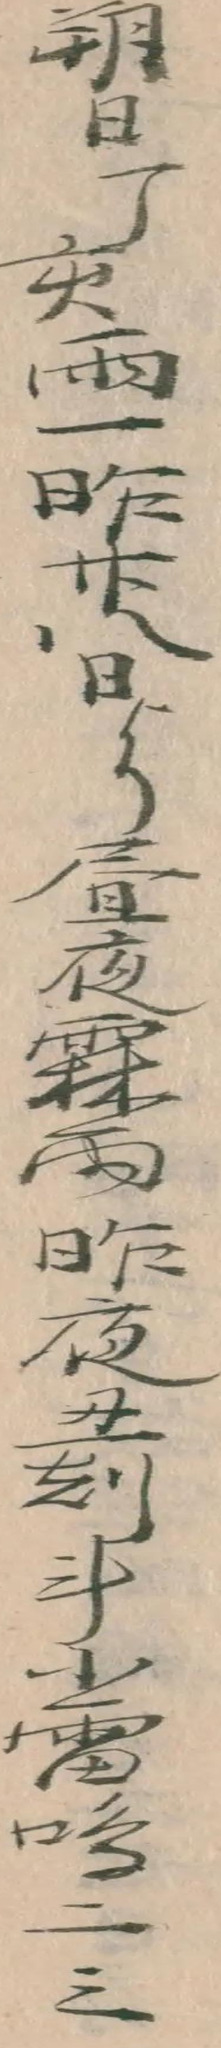朔日丁亥雨一昨廿八日より昼夜霖雨昨夜丑刻斗小雷鳴二三
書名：賀茂社記録. 第65冊
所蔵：国立国会図書館 National Diet Library, JAPAN
